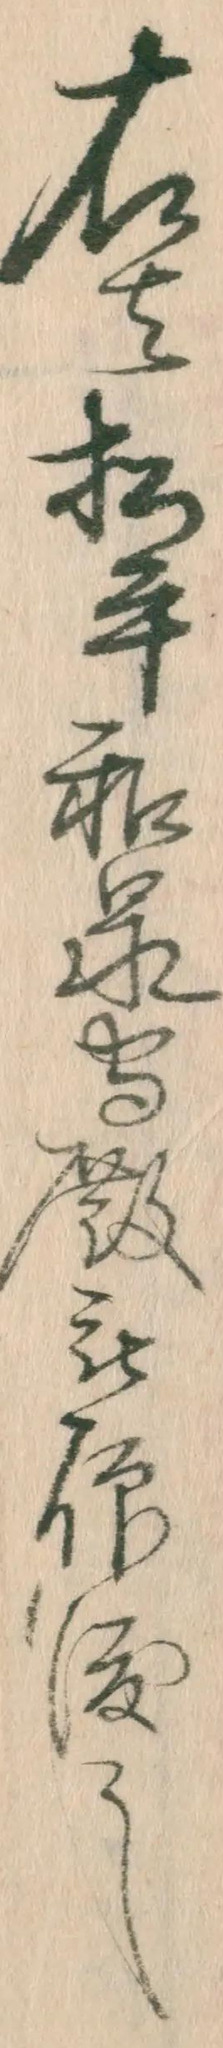右は松平和泉守殿被仰渡之
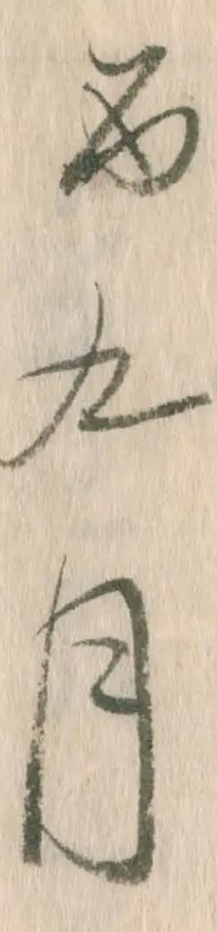酉九月

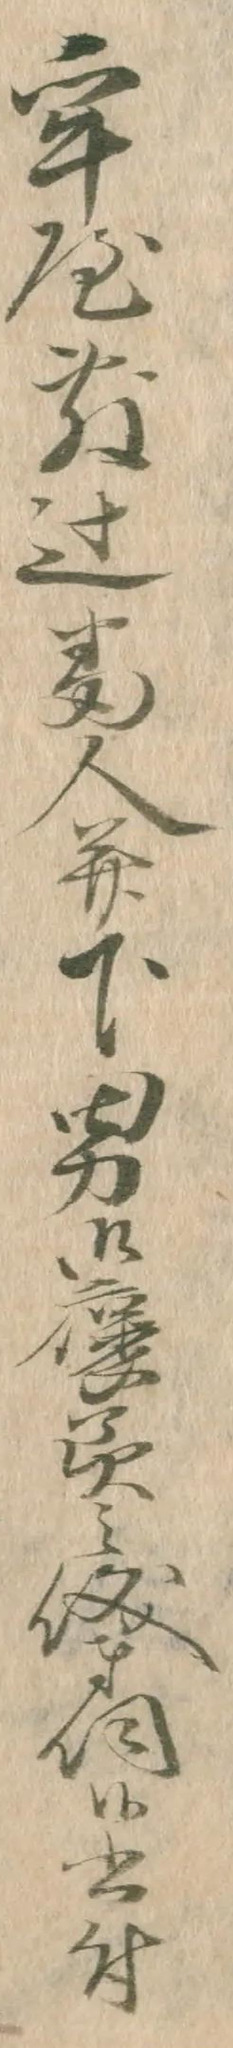│牢屋敷辻番人幷下男御褒美之儀奉伺候書付
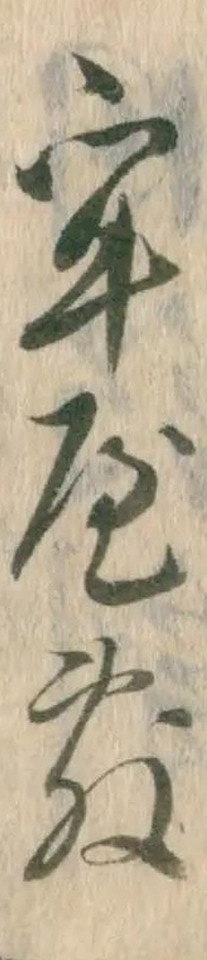牢屋敷
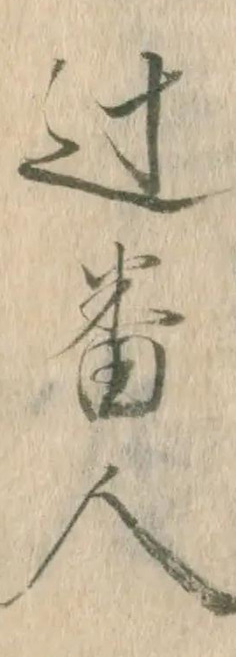辻番人

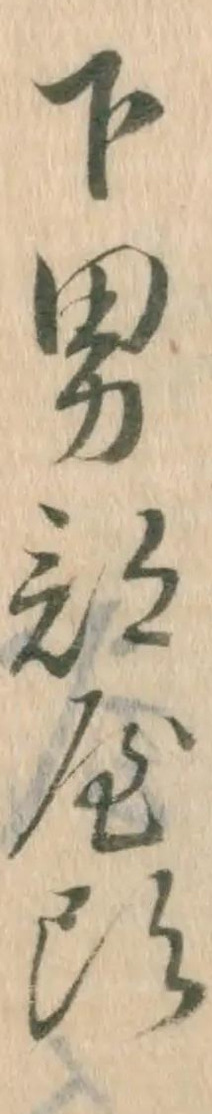下男部屋頭
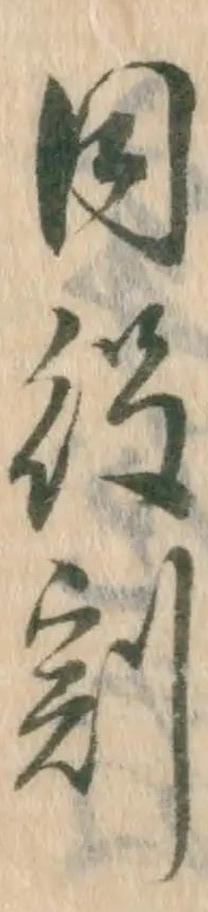同役割
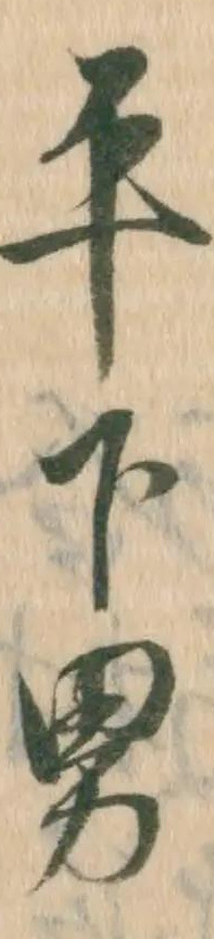平下男
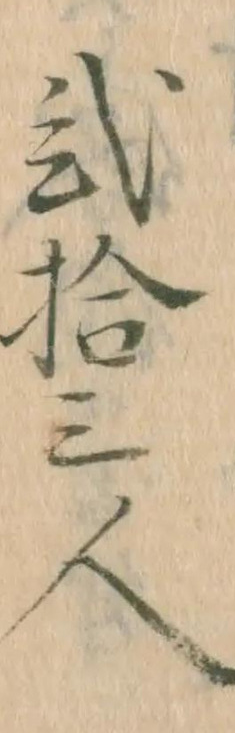弐拾三人
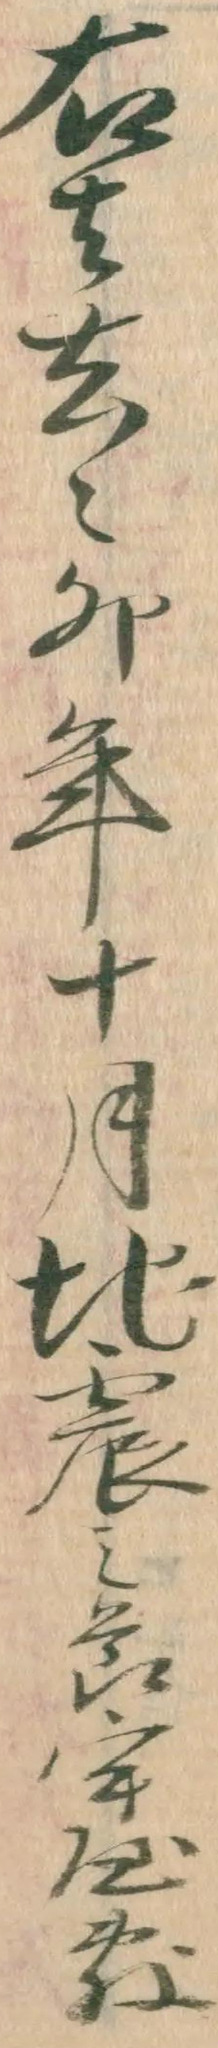右は去〻卯年十月地震之節牢屋敷
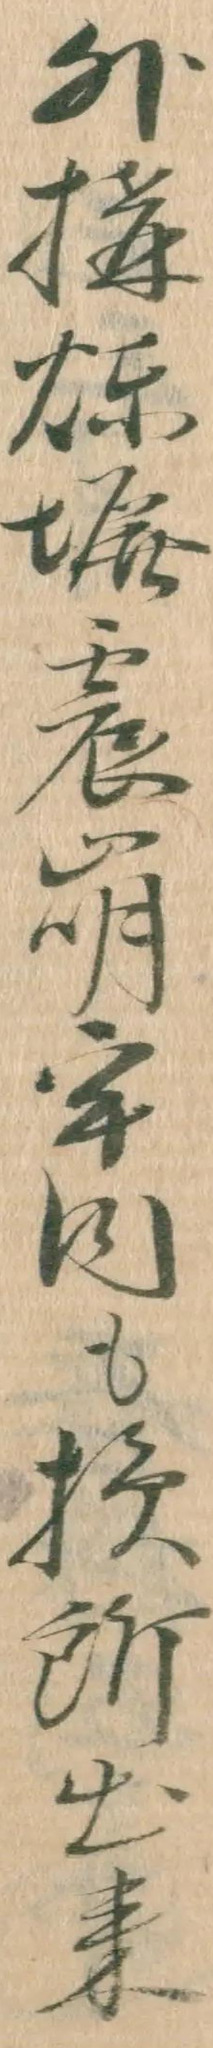外構煉塀震崩牢内も損所出来
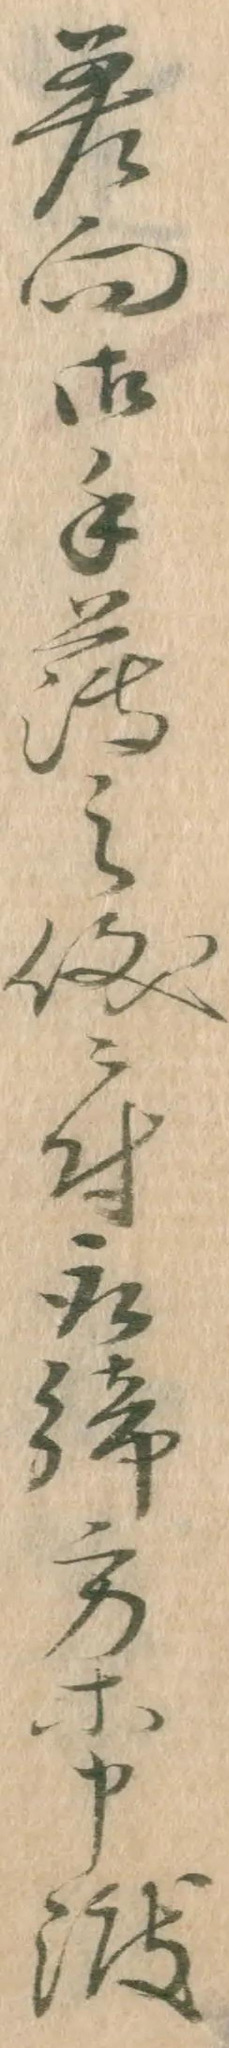差向御手薄之儀ニ付取締方等申渡
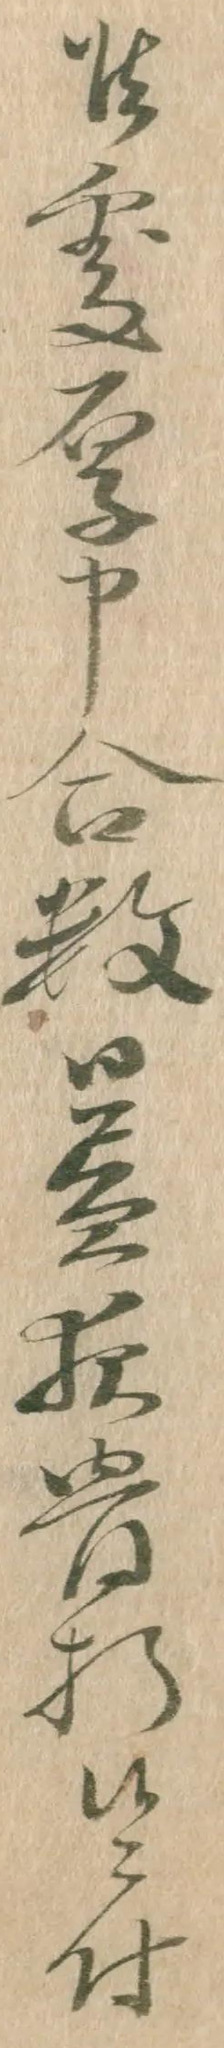候処厚申合数日昼夜骨折候ニ付
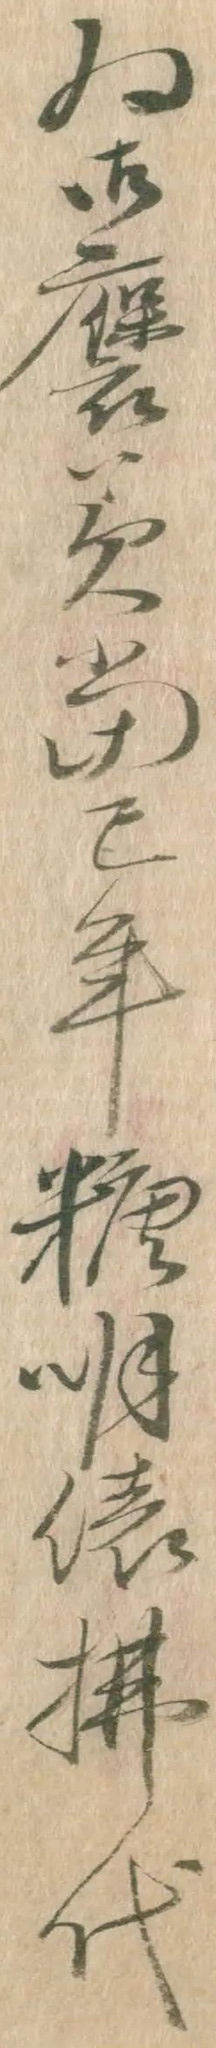為御褒美当巳年糠明俵払代
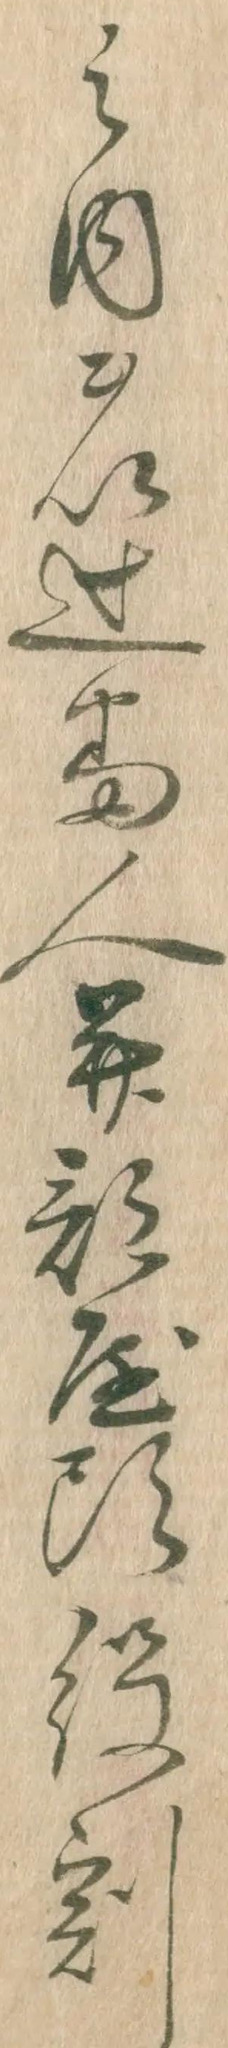之内ヲ以辻番人幷部屋頭役割
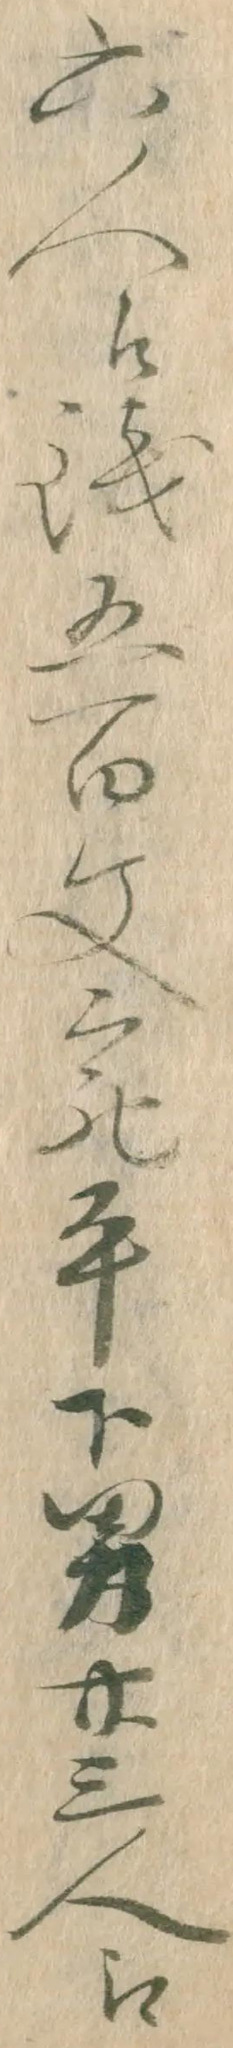六人え銭五百文宛平下男廿三人え
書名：七十冊物類集 71巻. [44] 四十三 牢屋敷御普請御修覆地震ニ付骨折候牢屋掛御褒美之部
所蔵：国立国会図書館 National Diet Library, JAPAN
